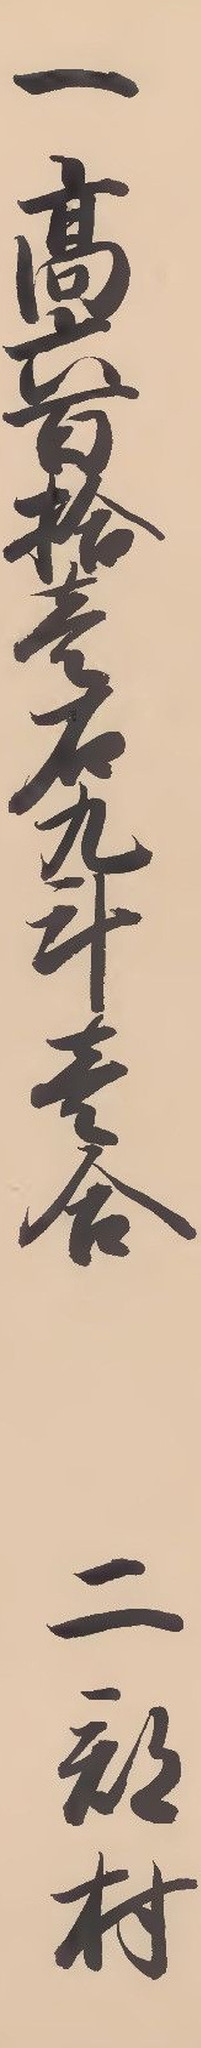一高六百拾壱石九斗壱合二部村
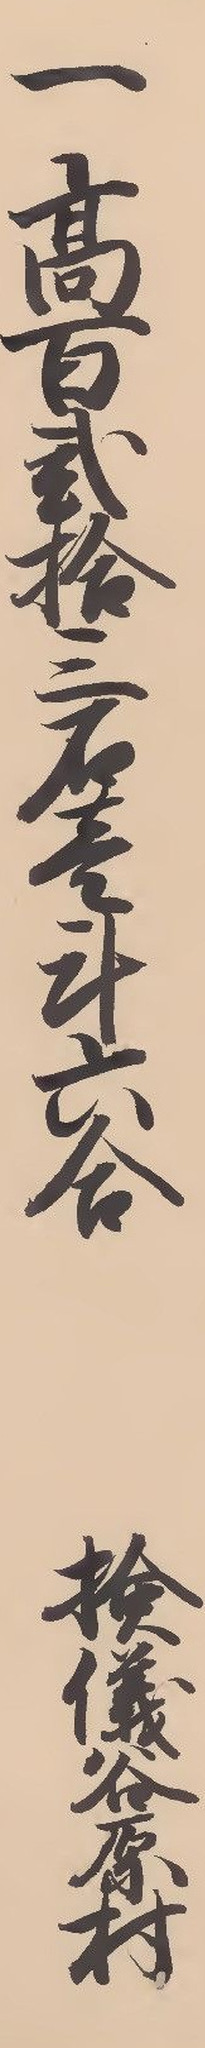一高百弐拾三石壱斗六合検儀谷原村
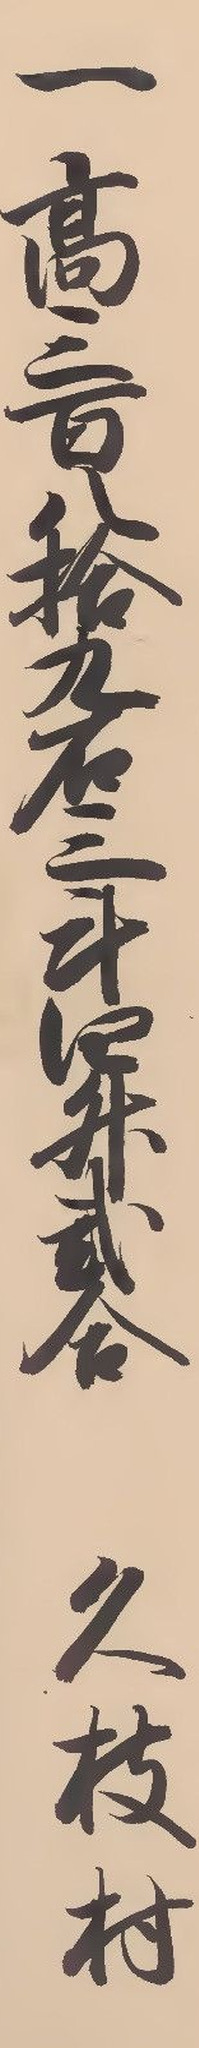一高三百八拾九石三斗四升弐合久枝村
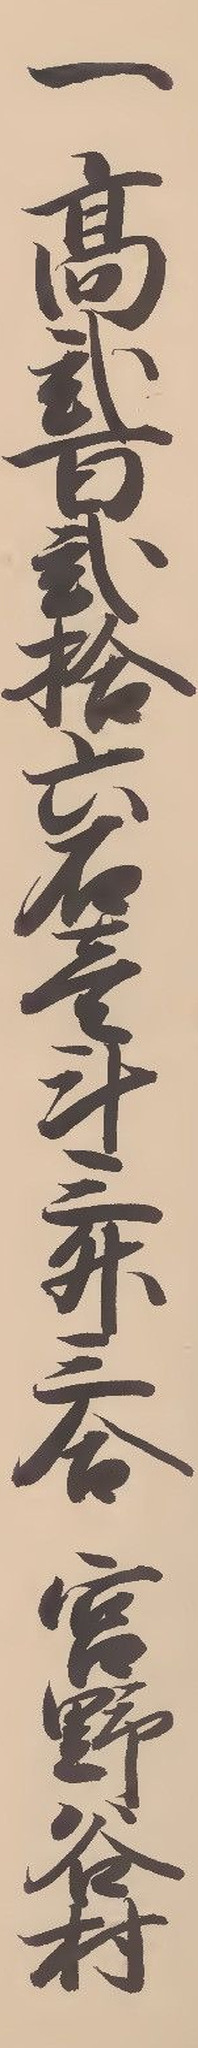一高弐百弐拾六石壱斗三升三合宮野谷村
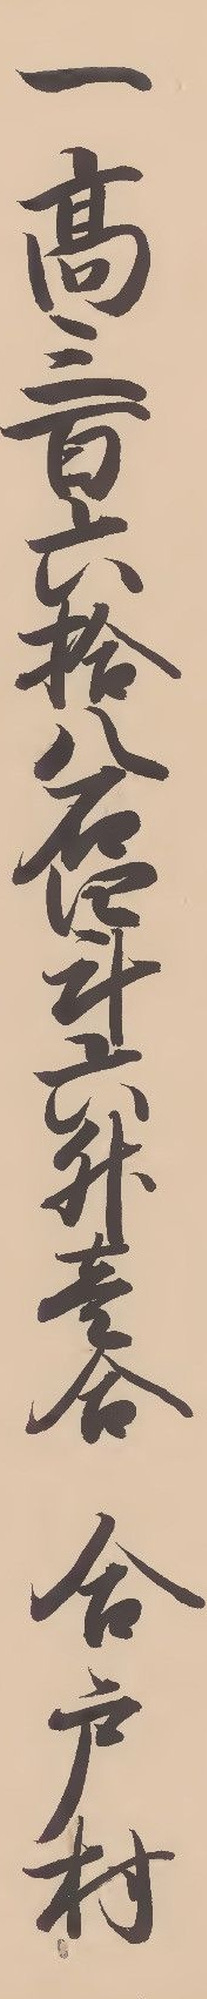一高三百六拾八石四斗六升壱合合戸村
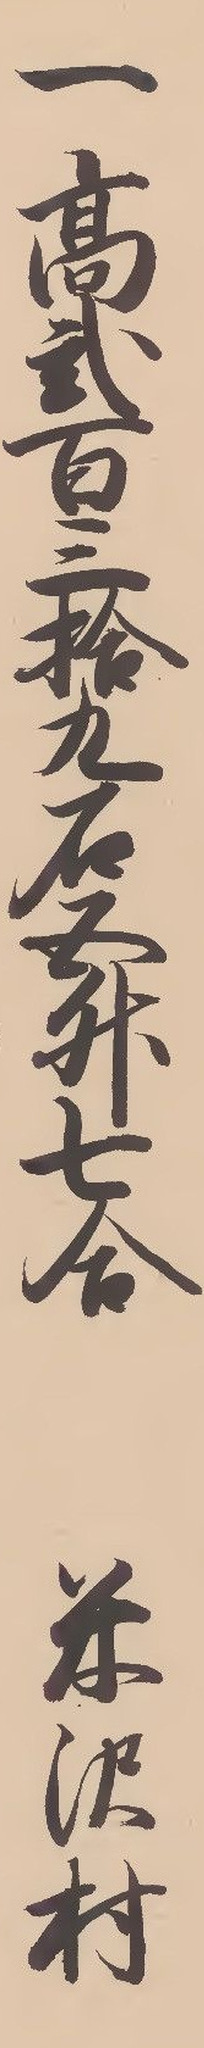一高弐百三拾九石五升七合米沢村
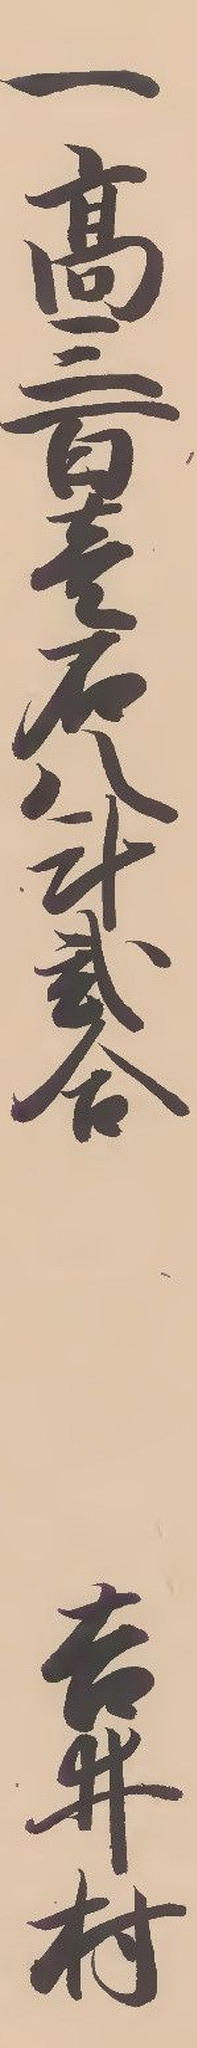一高三百壱石八斗弐合吉井村

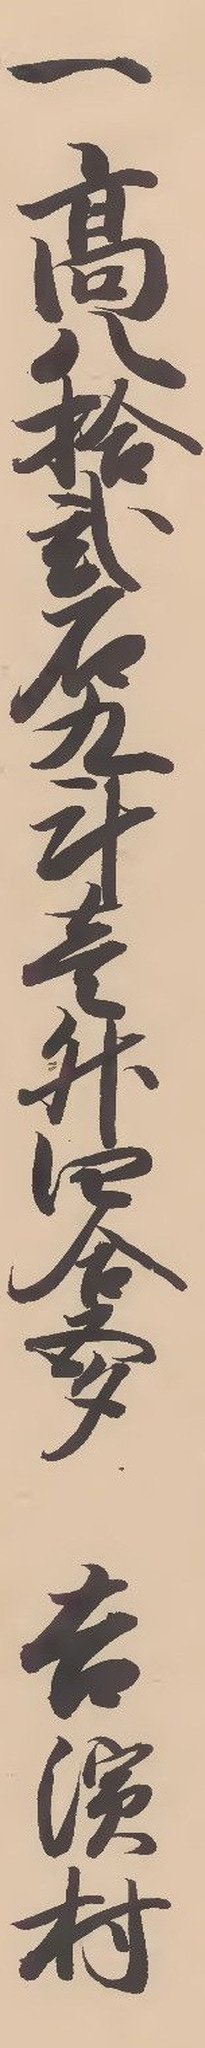一高八拾弐石九斗壱升四合五勺吉浜村
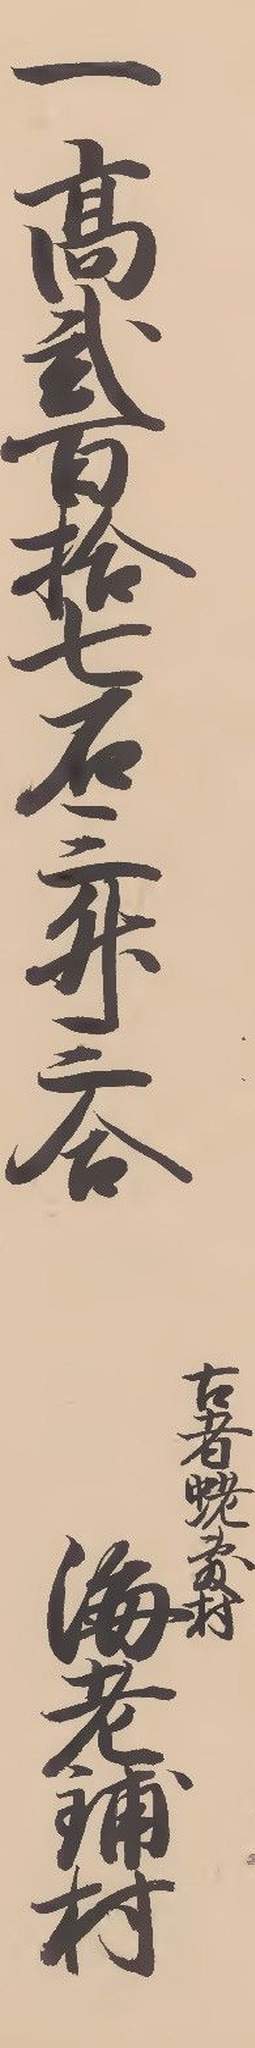一高弐百拾七石三升三合海老鋪村
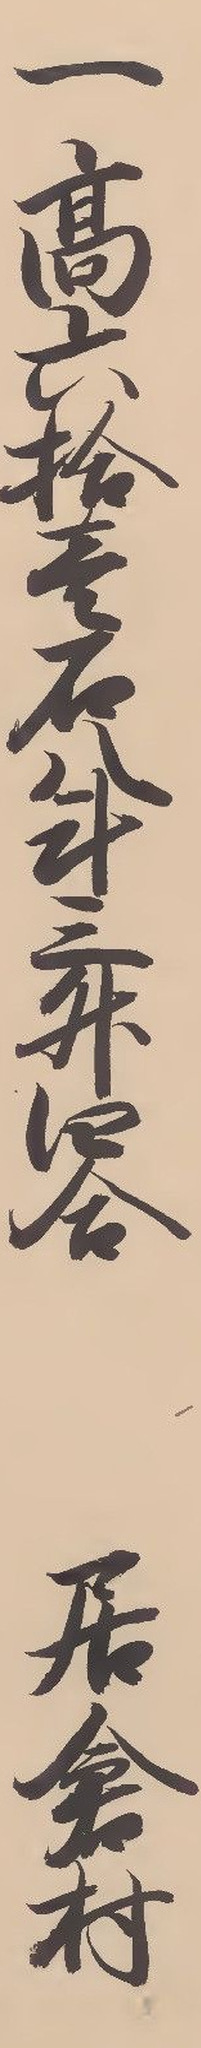一高六拾壱石八斗三升四合居倉村
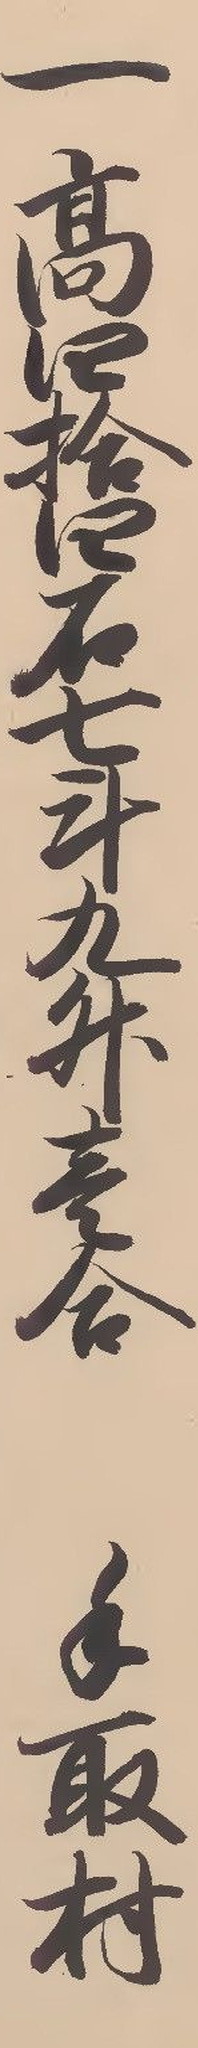一高四拾四石七斗九升壱合手取村
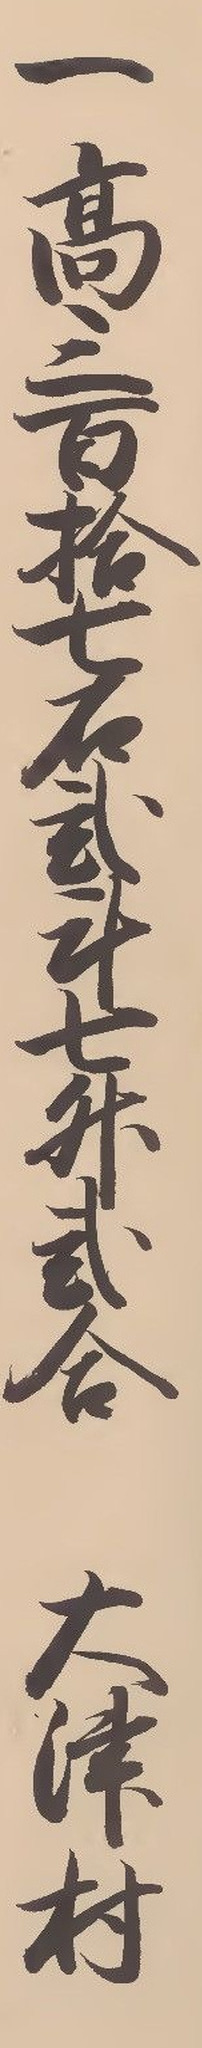一高三百拾七石弐斗七升弐合大津村
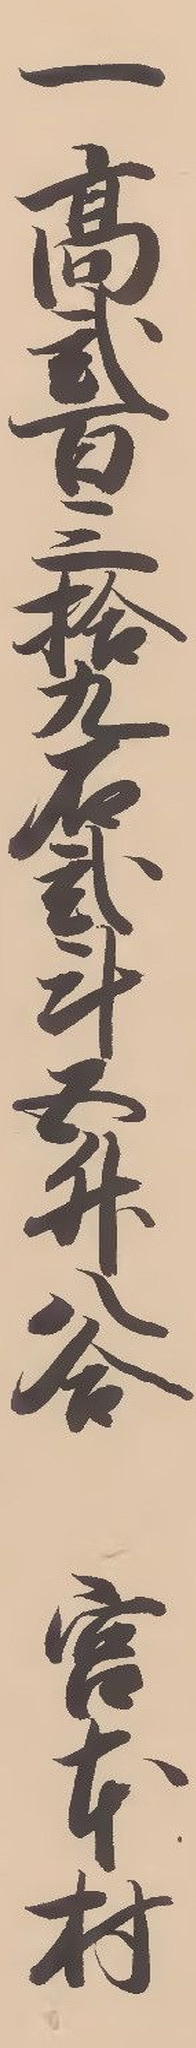一高弐百三拾九石弐斗五升八合宮本村
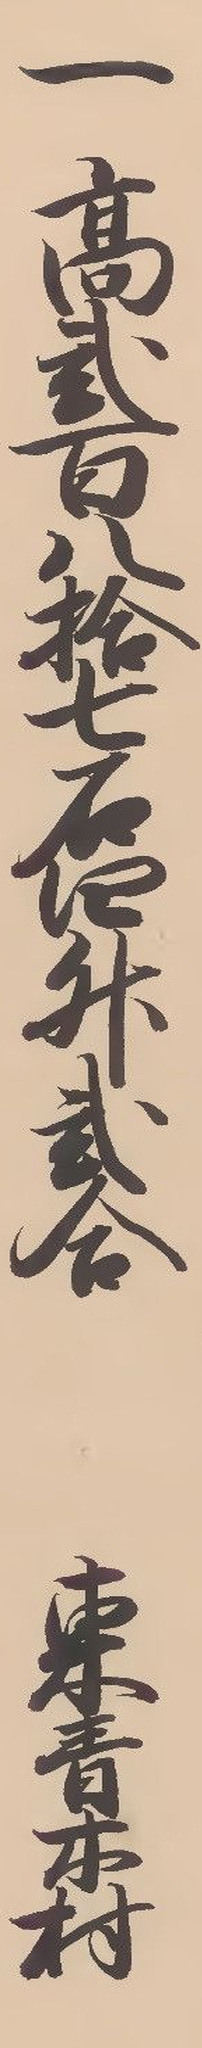一高弐百八拾七石四升弐合東青木村
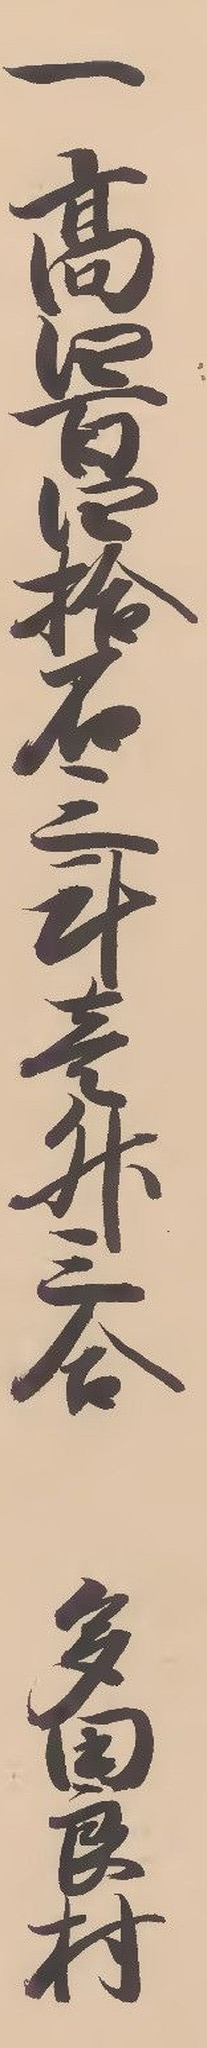一高四百四拾石三斗壱升三合多田良村

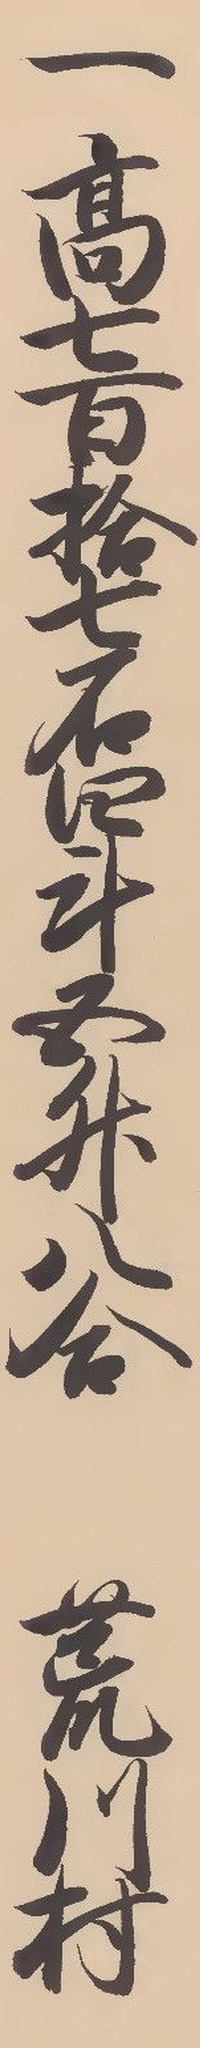一高七百拾七石四斗五升八合荒川村
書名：安房国郷帳
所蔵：国立公文書館 National Archives of Japan
